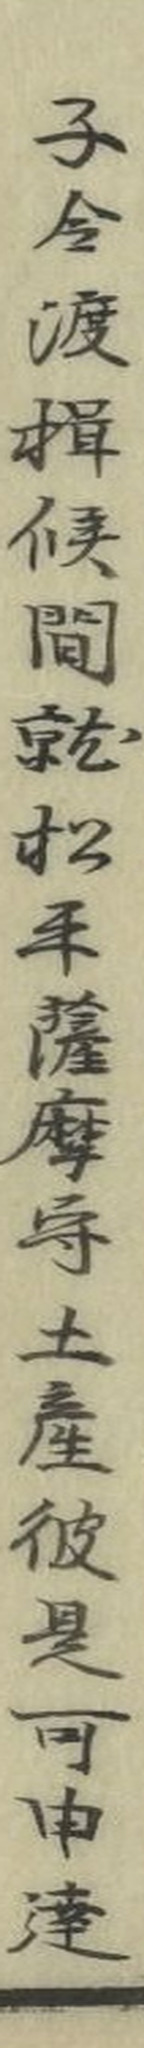子妹令渡楫候間就松平薩摩守土産彼是可申達
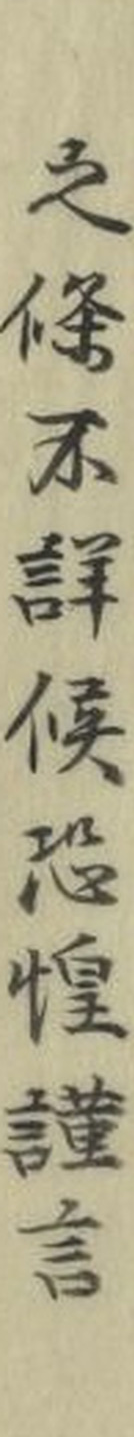之條不詳候恐惶謹言
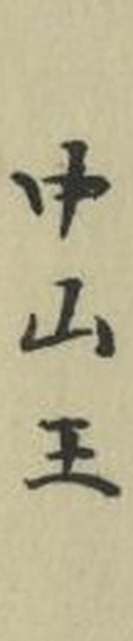中山王
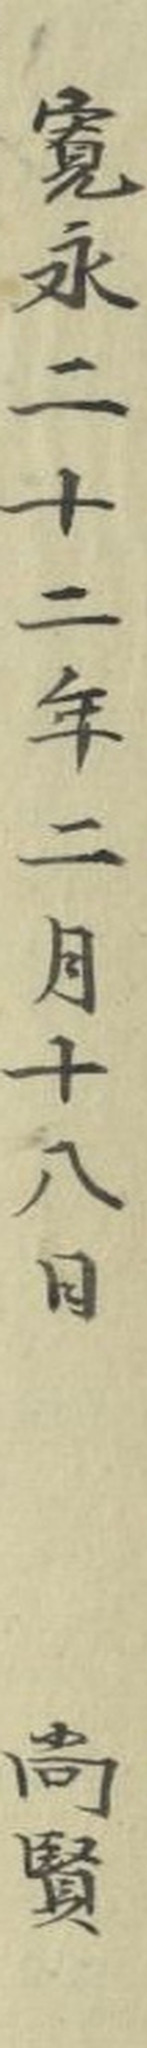寛永二十二年二月十八日尚賢
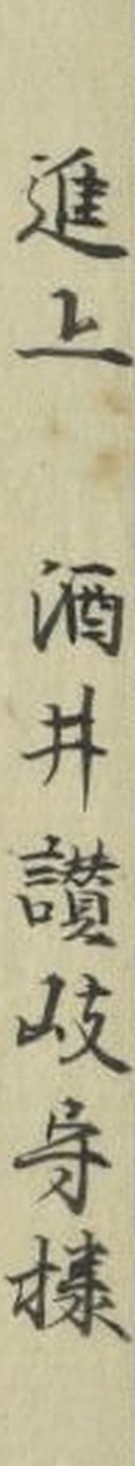進上酒井讃岐守様
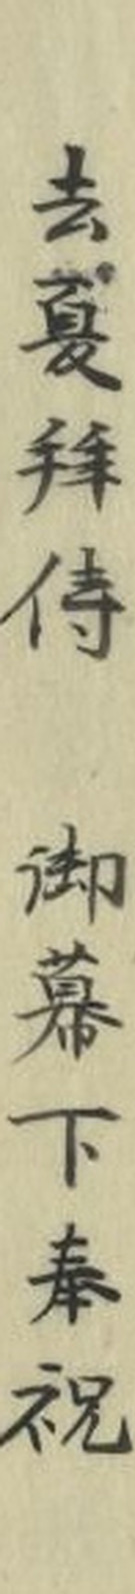去夏拝侍御幕下奉祝
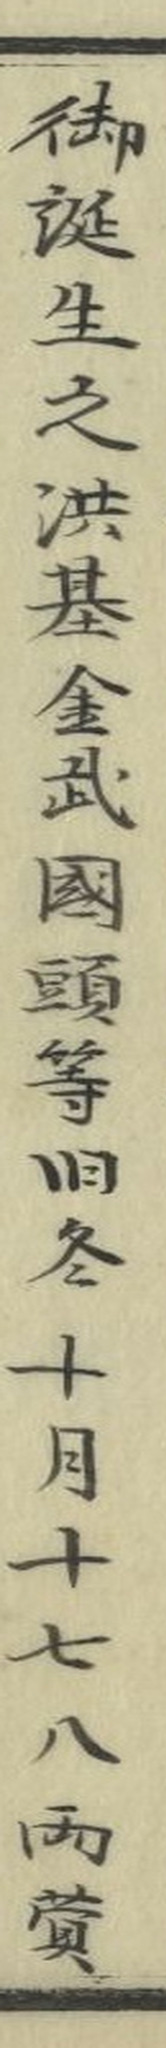御誕生之洪基金武国頭等旧冬十月十七八両蓂
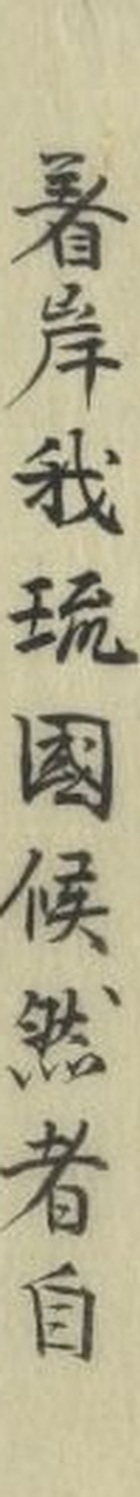着岸我琉国候然者自
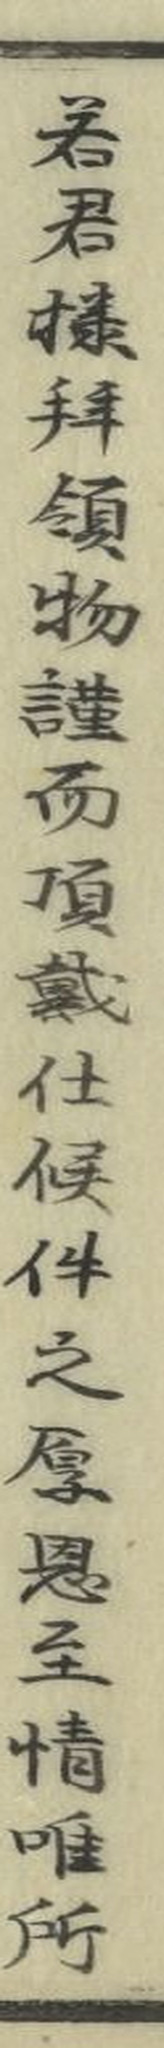若君様拝領物謹而頂戴仕候件之厚恩至情け唯所
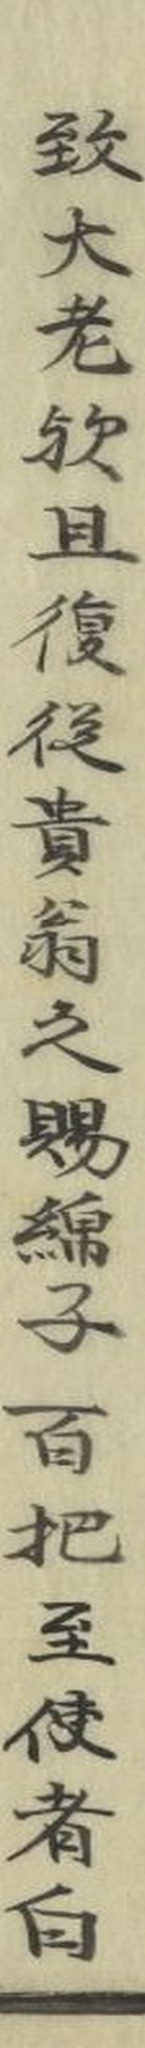致大老欤且復従貴翁之賜綿子百把至使者白
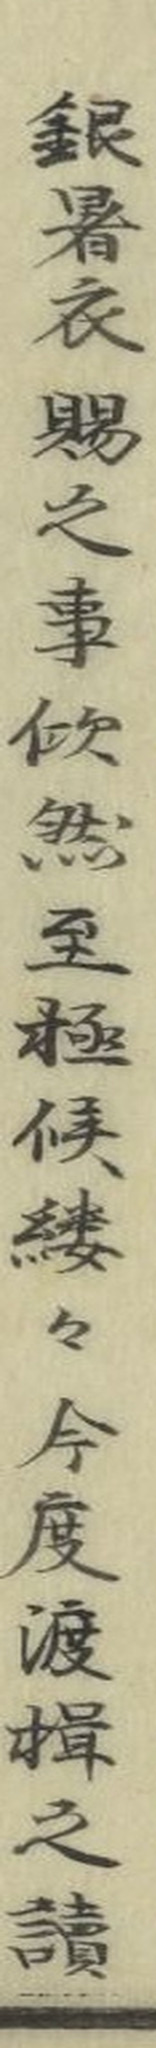銀夏衣賜之事依然至極候縷々今度楫之読
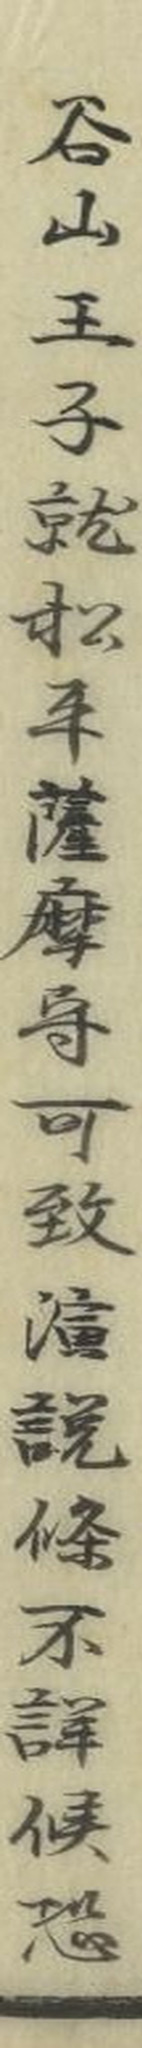谷山王子就松平薩摩守可到演説條不詳候恐

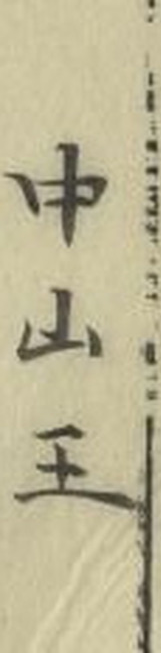中山王
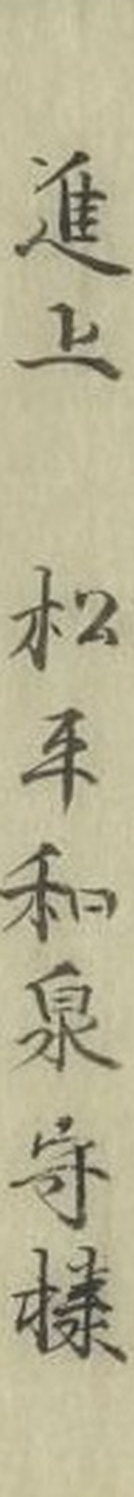進上松平和泉守様
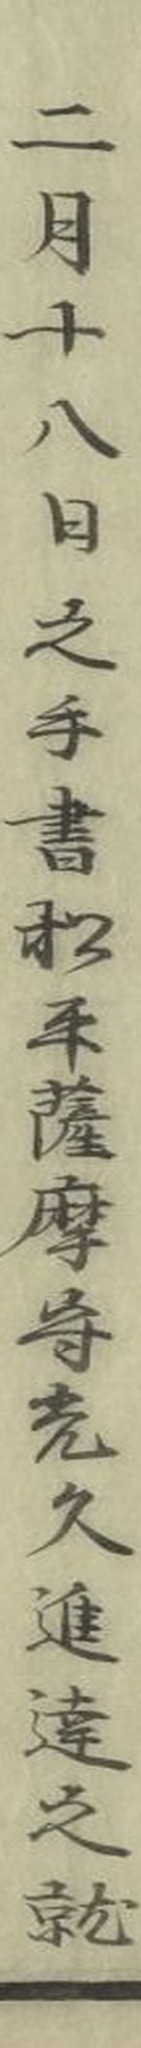二月十八日之手書松平薩摩守充久信達之就
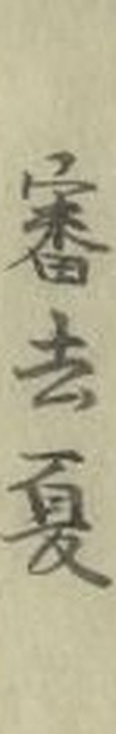審去夏
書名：琉球往来（上）
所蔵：University of the Ryukyus Library
